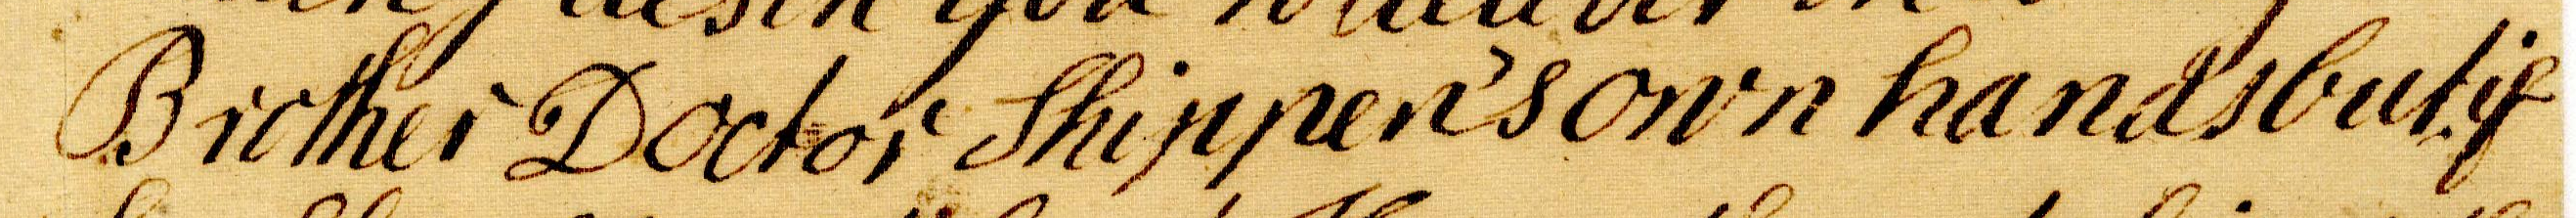Brother Doctor Shippen's own hands but if
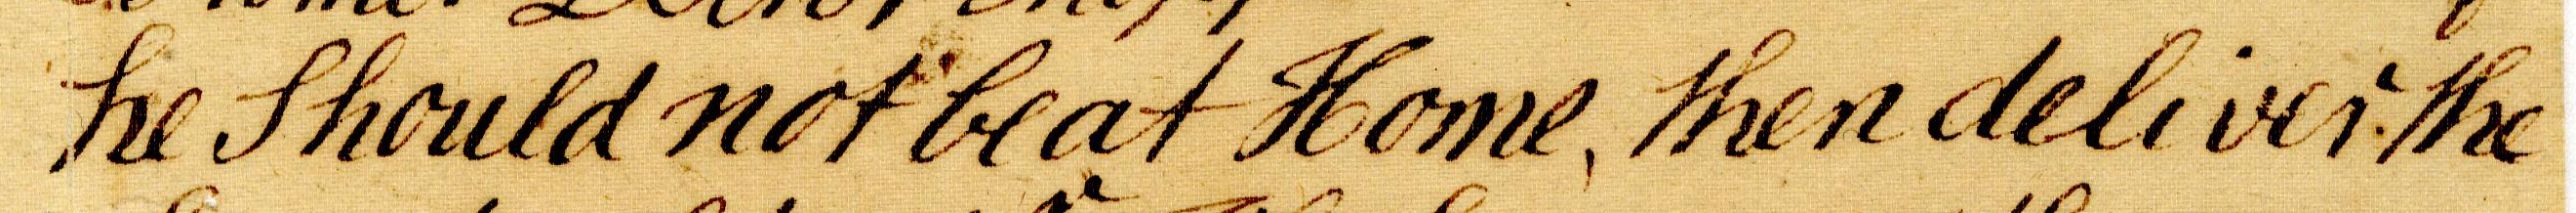he Should not be at Home, then deliver the
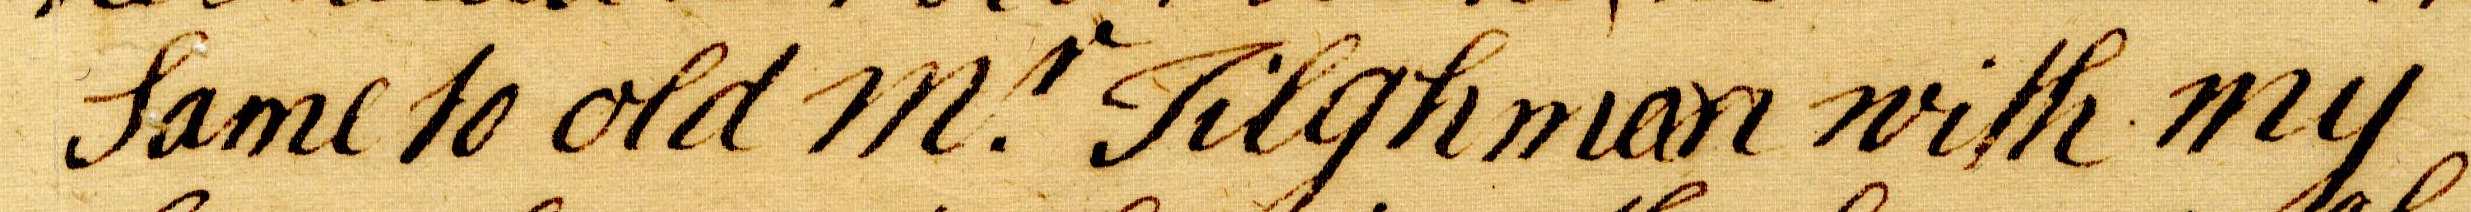Same to old M^r. Tilghman with my
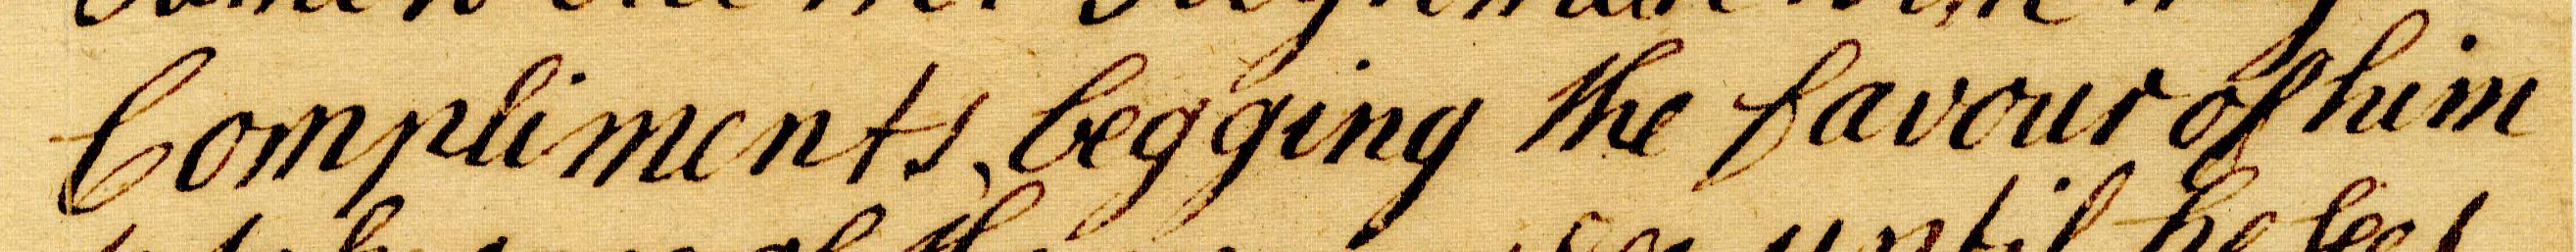Compliments, begging the favour of him
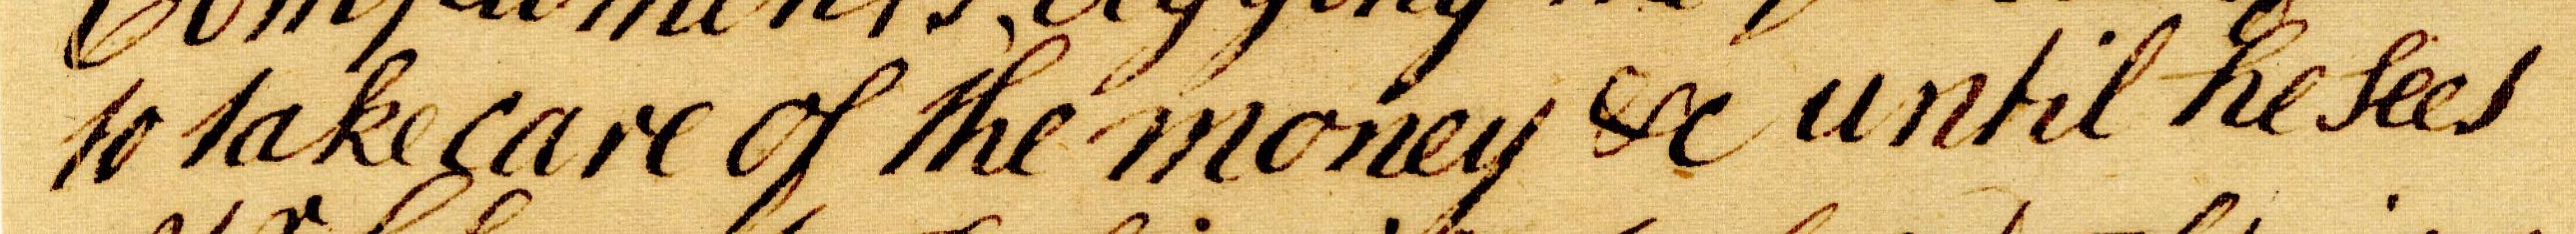to take care of the money &c until he sees
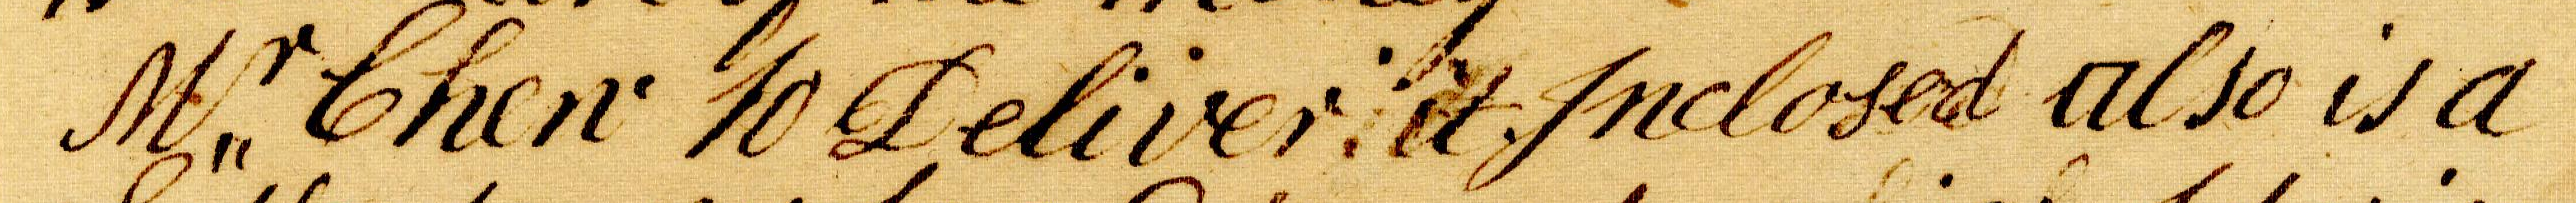M^r. Chew to Deliver it. Inclosed also is a
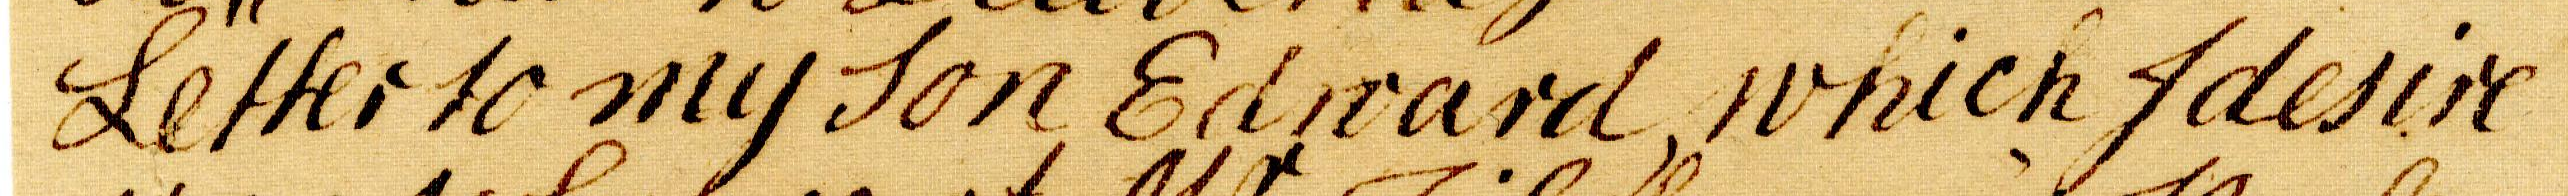Lefter to my Son, Edward, Which I desire
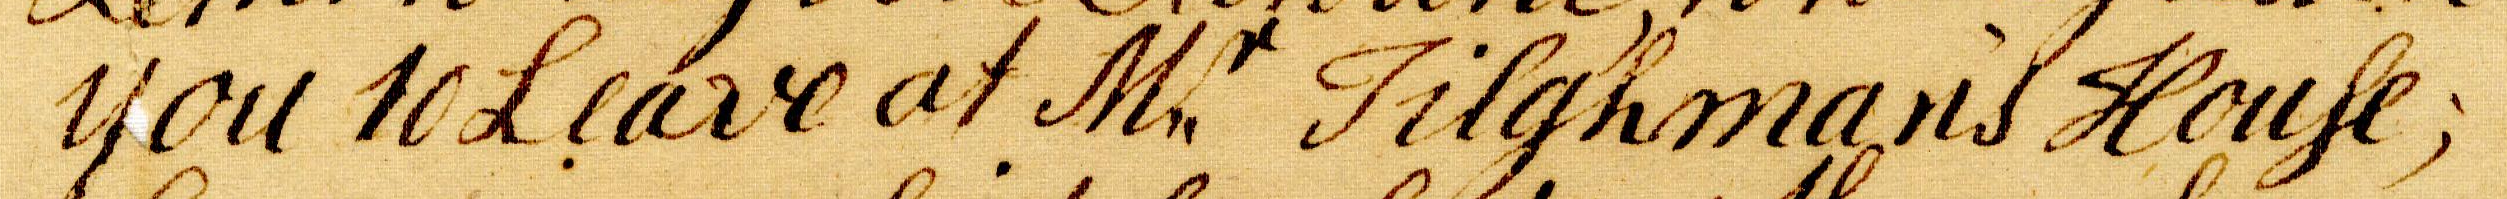You to Leave at M^r. Tilghman's House;
